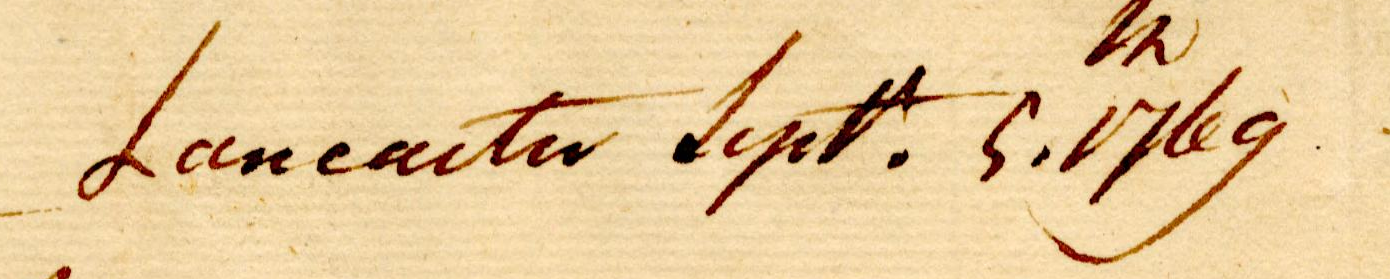Lancaster Sept^r 5^th 1769
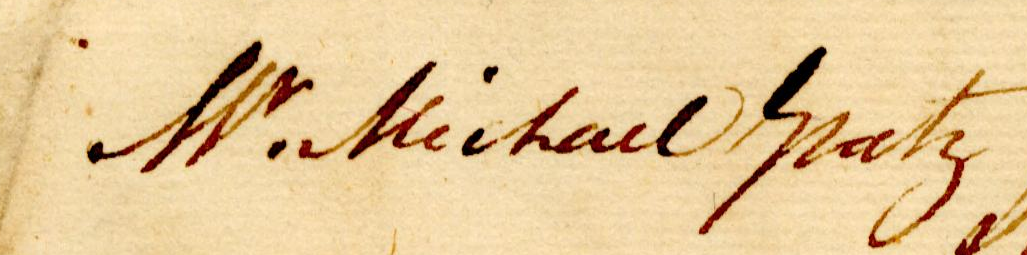M^r Michael Gratz
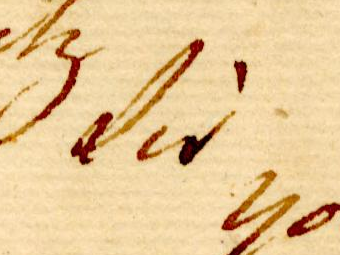Sir
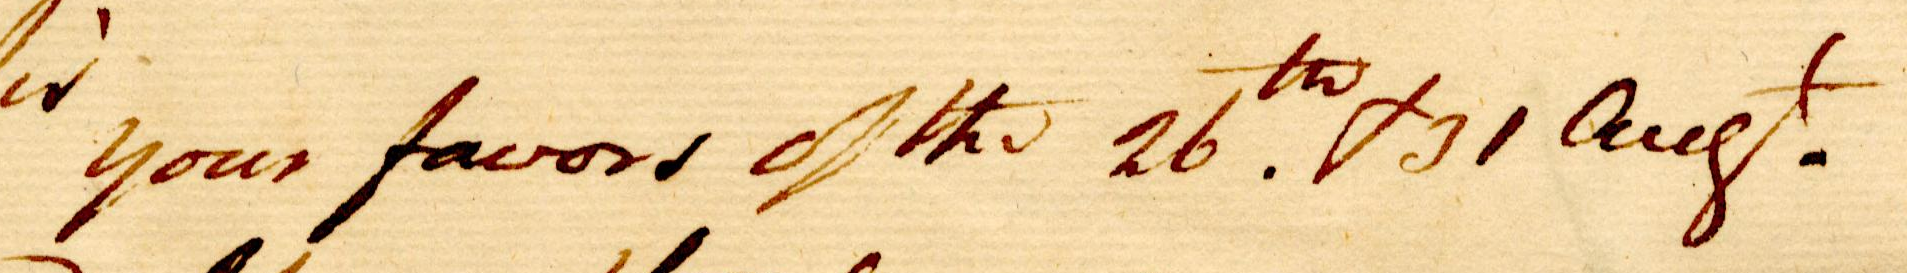your favors of the 26^th. & 31 Aug^t.
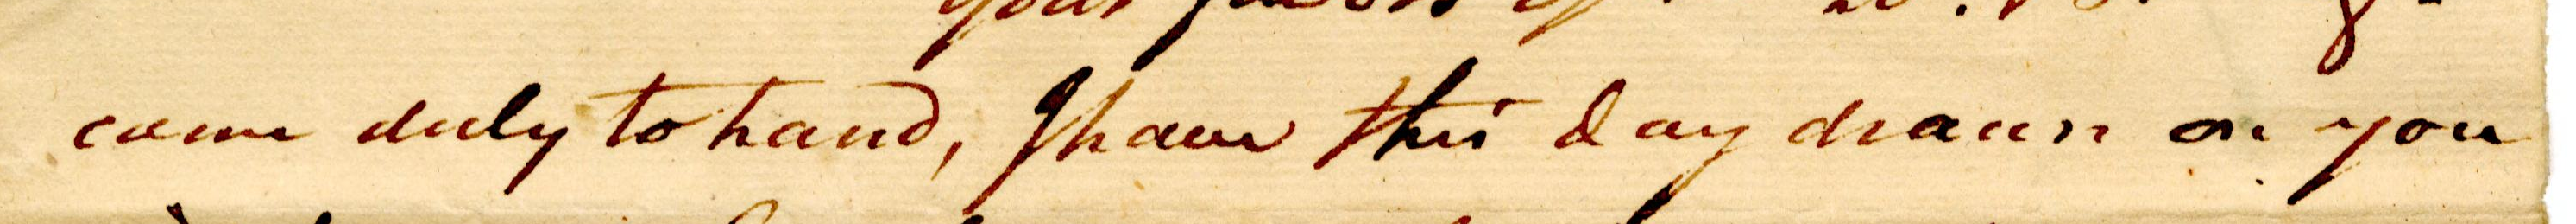came duly to hand, I have this day drawn on you
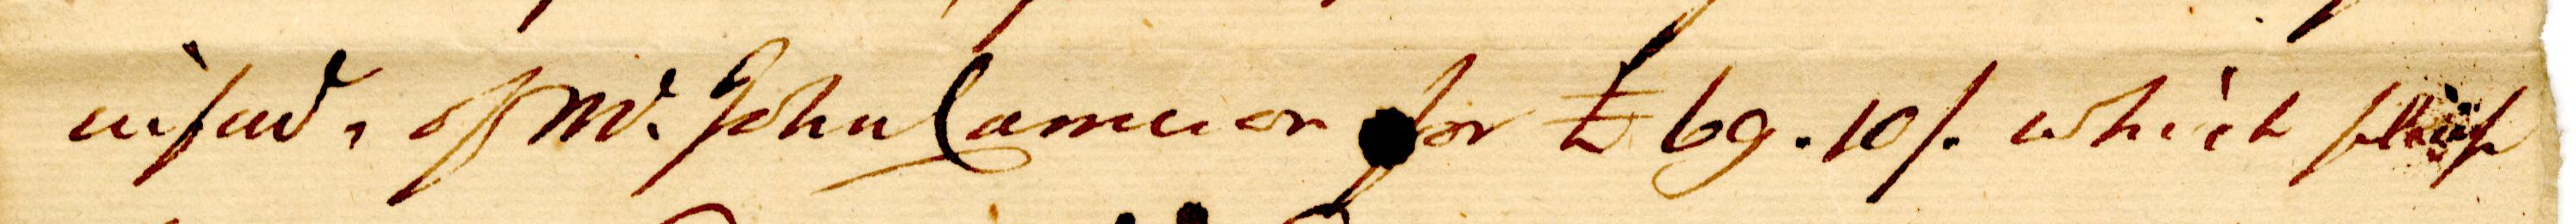in fav^r. of M^r John Cameron for £69.10s. which please
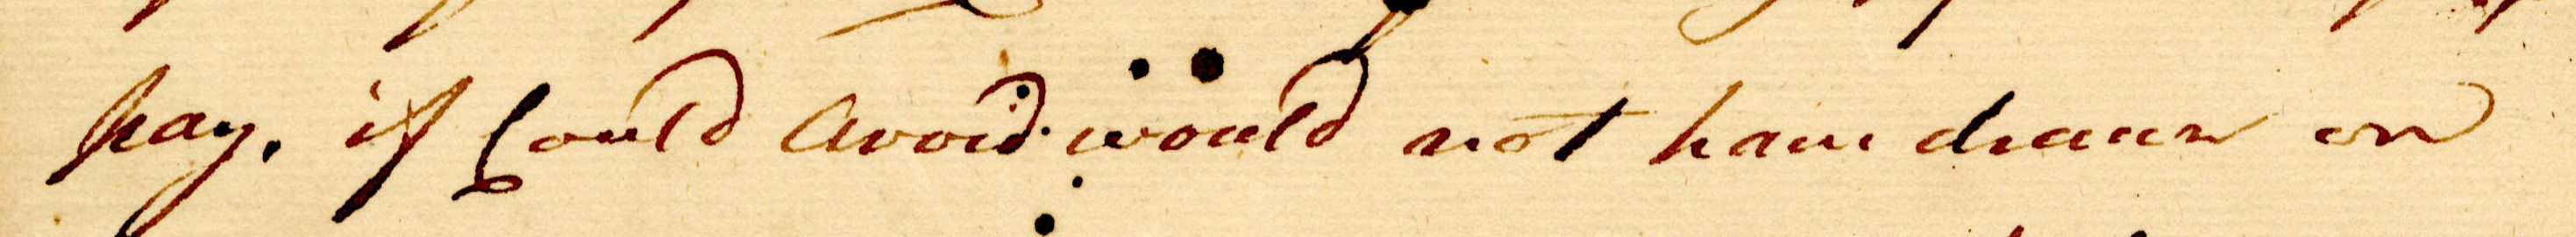pay, if Could avoid would not have drawn on
